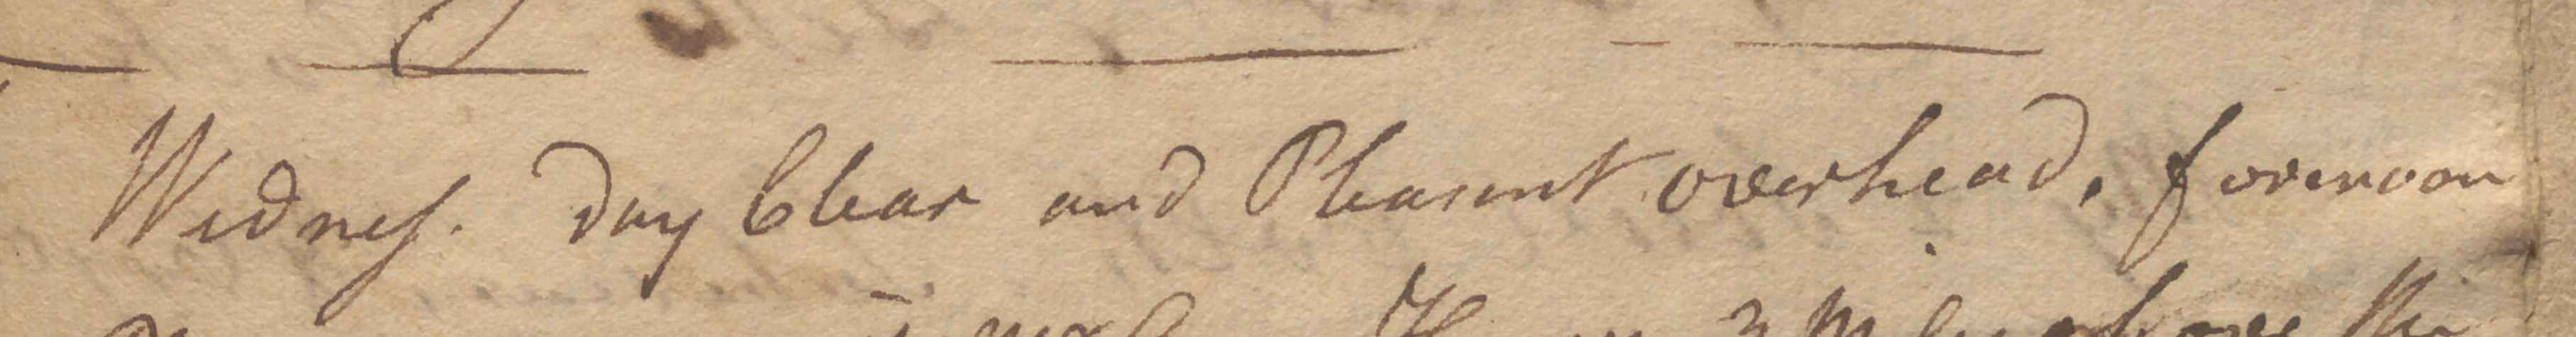Wednes. day Clear and Pleasent overhead, forenoon
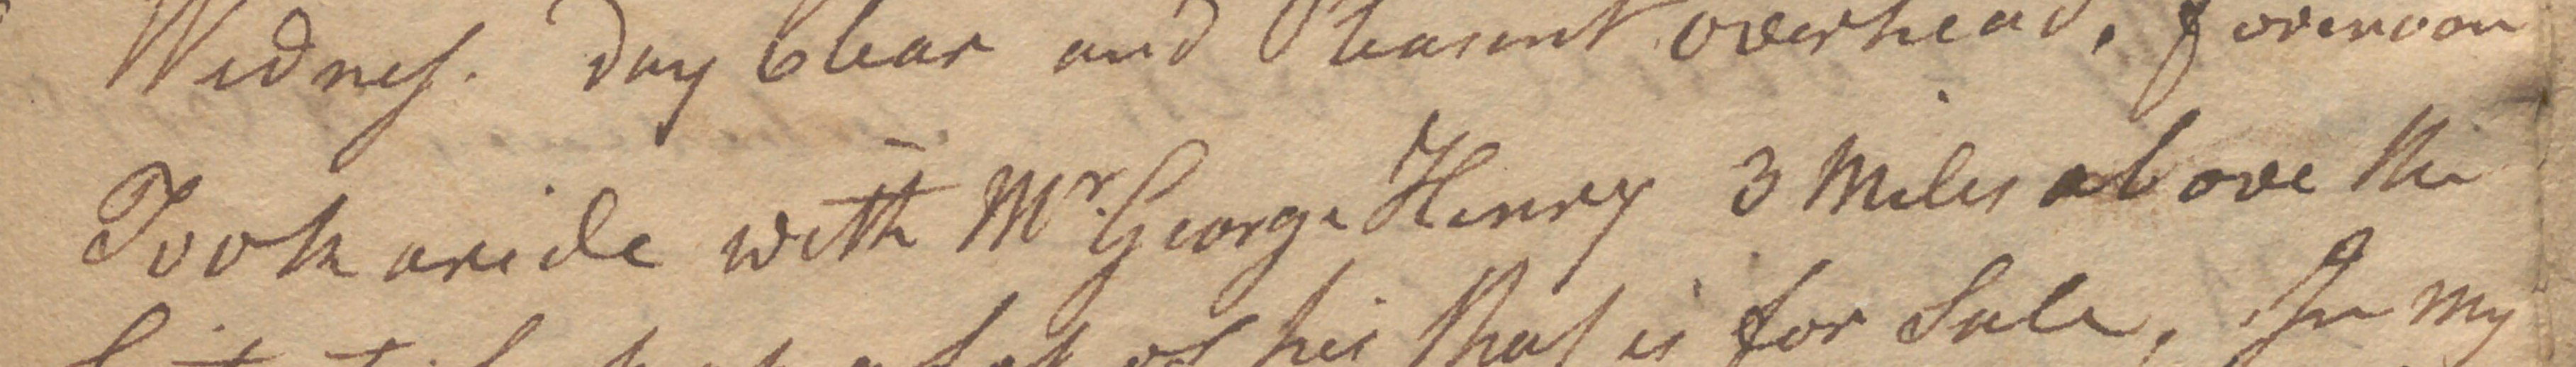Took a ride with M^r. George Henry 3 miles above the
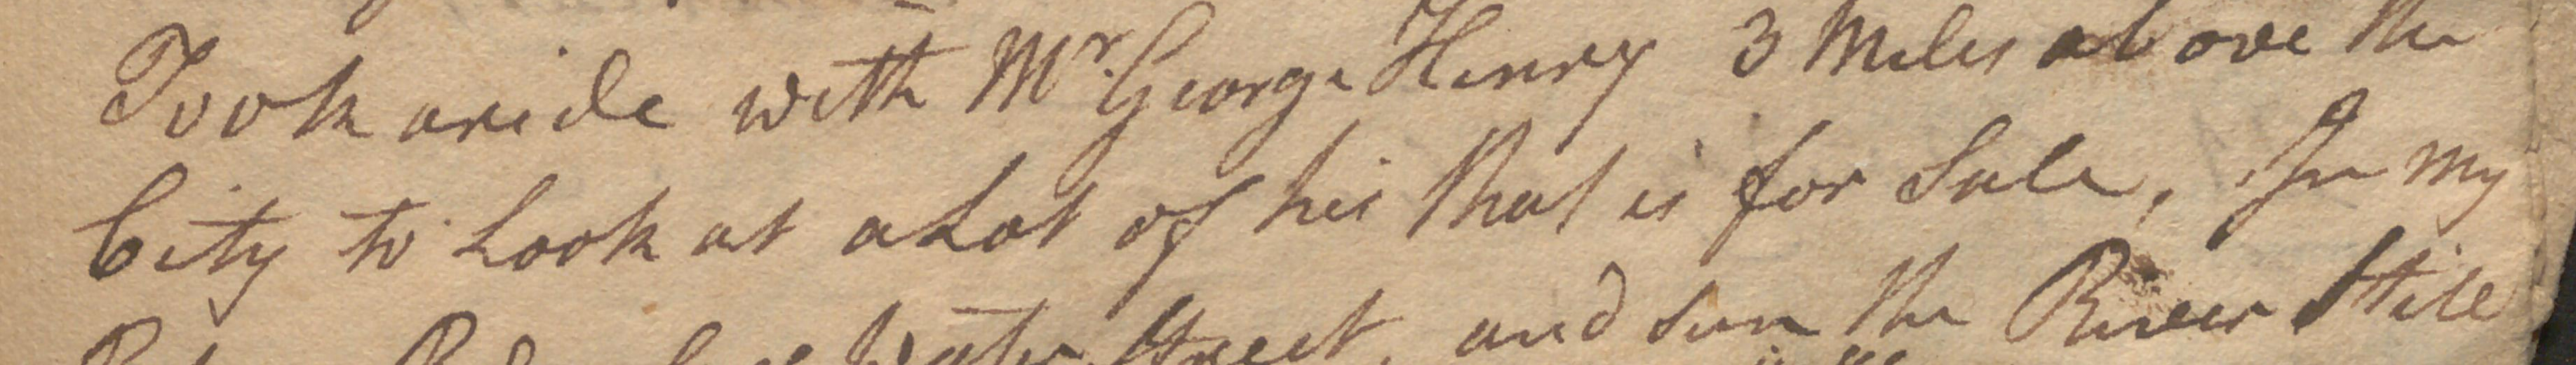City to look at a Lot of his that is for Sale, In my
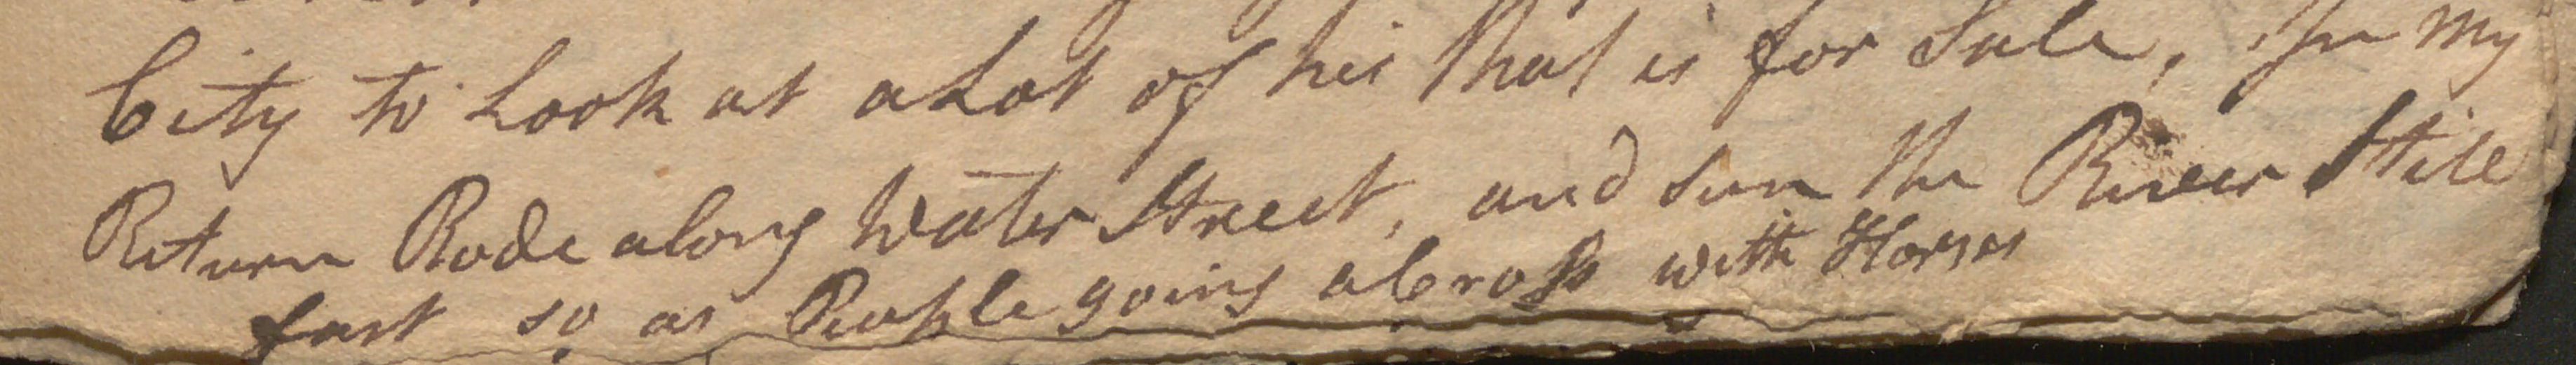Return Rode along Water Street, and don the River Hill
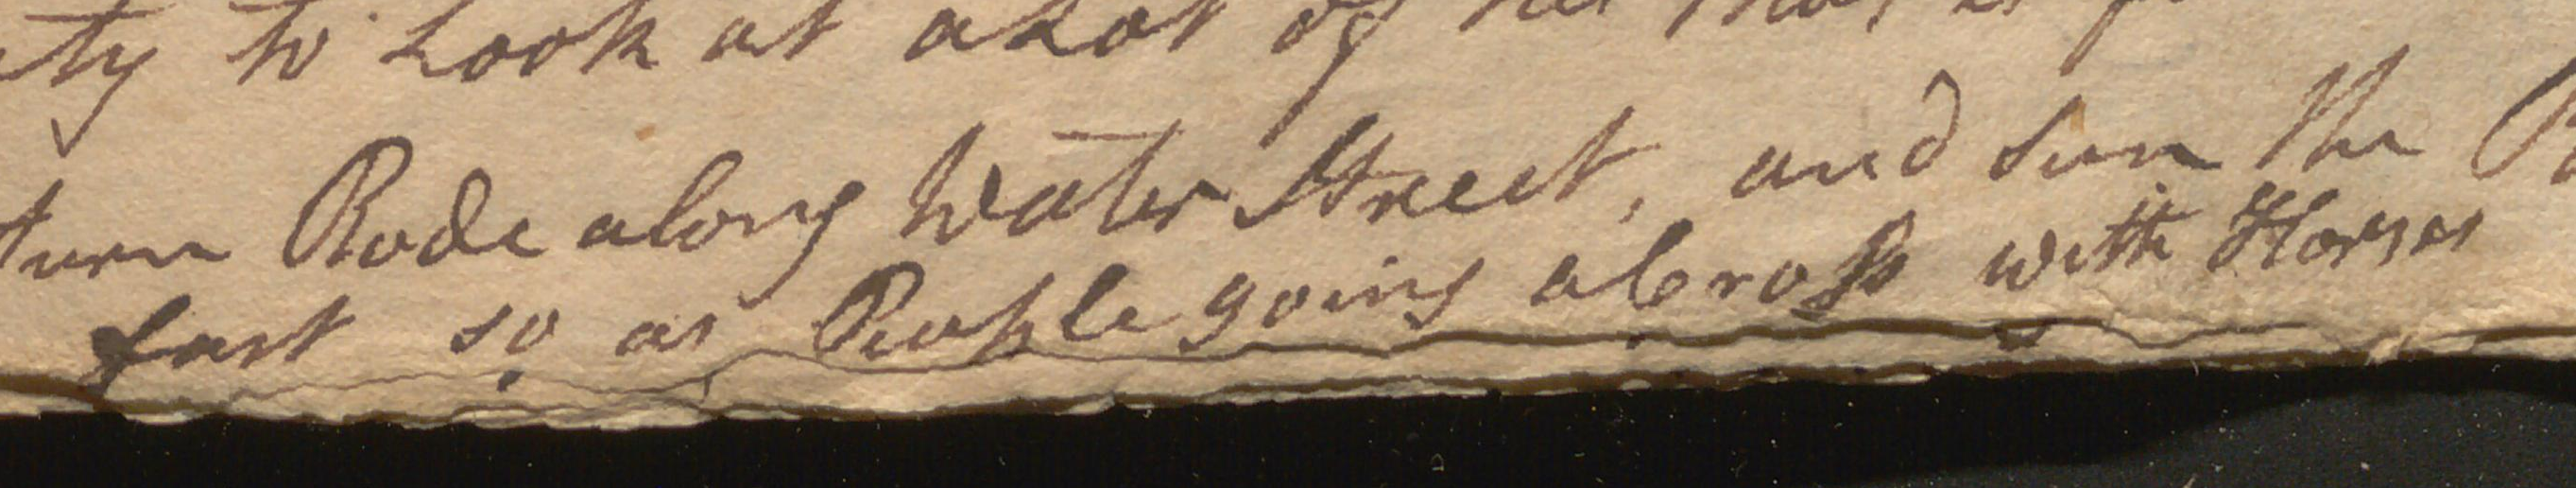fast so as People going a a Cross with Horses
